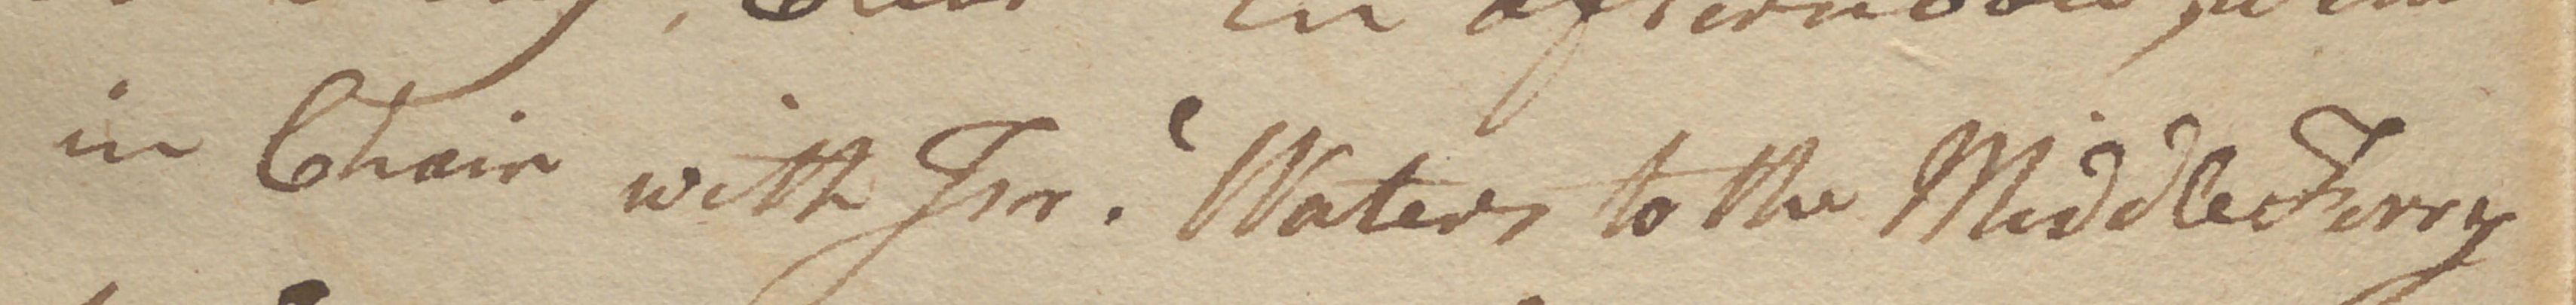in Chair with Isr^l. Waters to the Middle Ferry
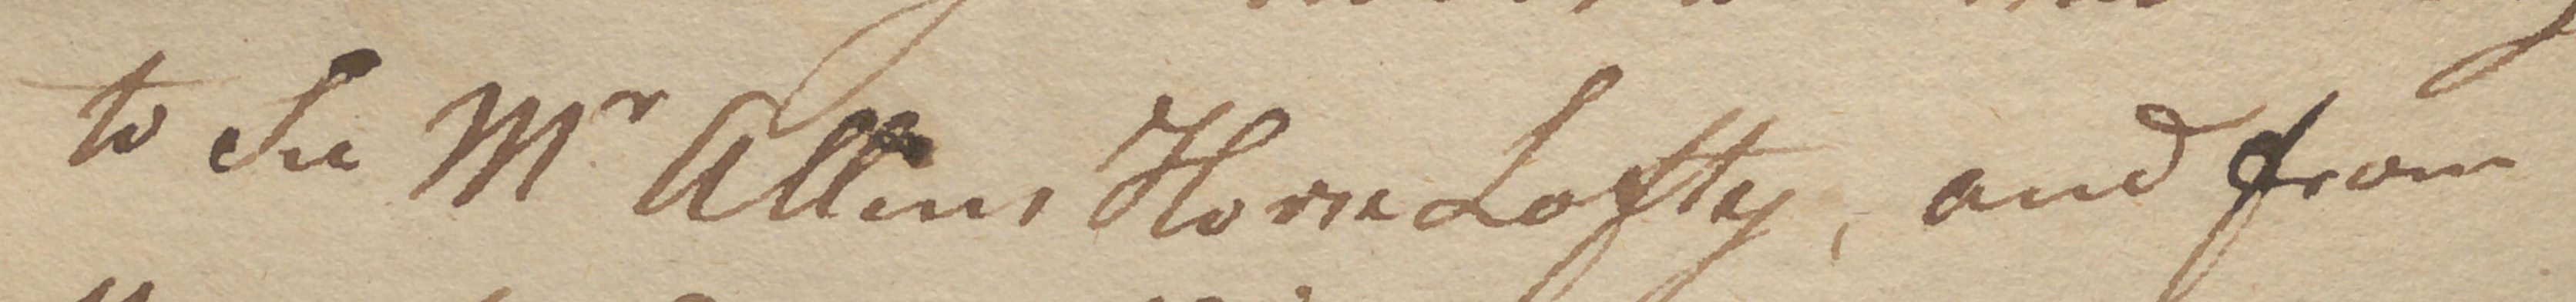to see M^r. Allins Horse Lofty, and from
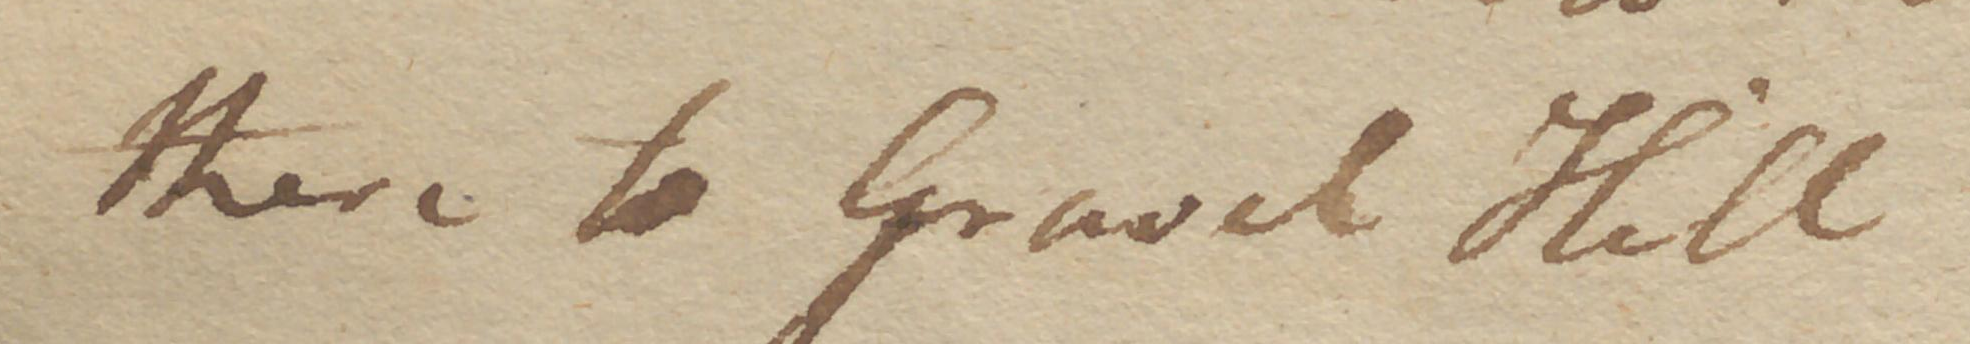there to Gravel Hill
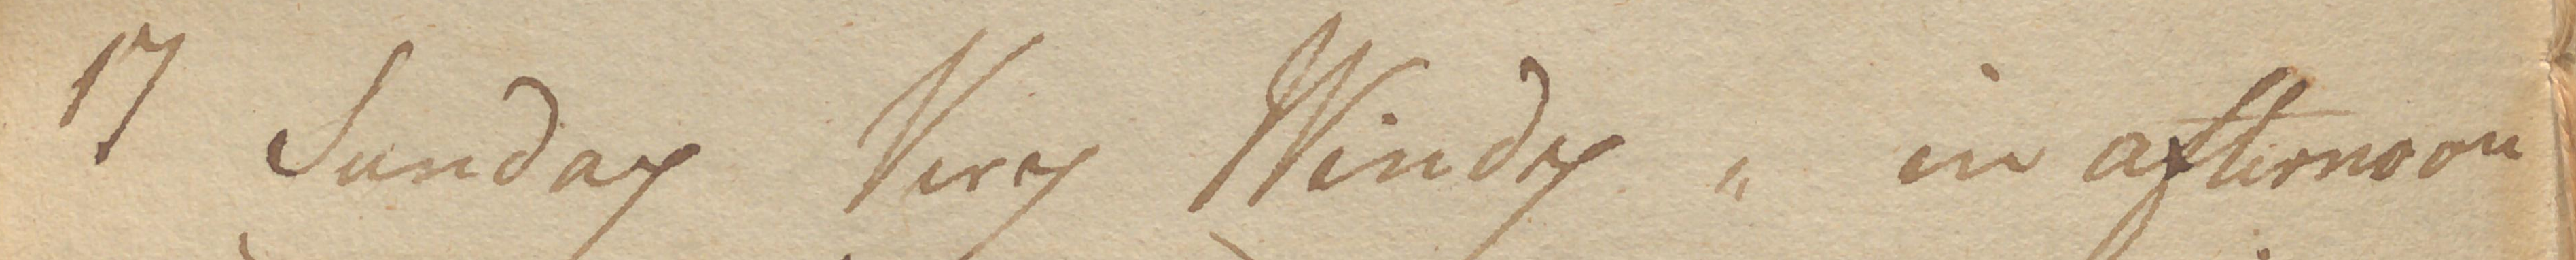17 Sunday Very Windy, in afternoon
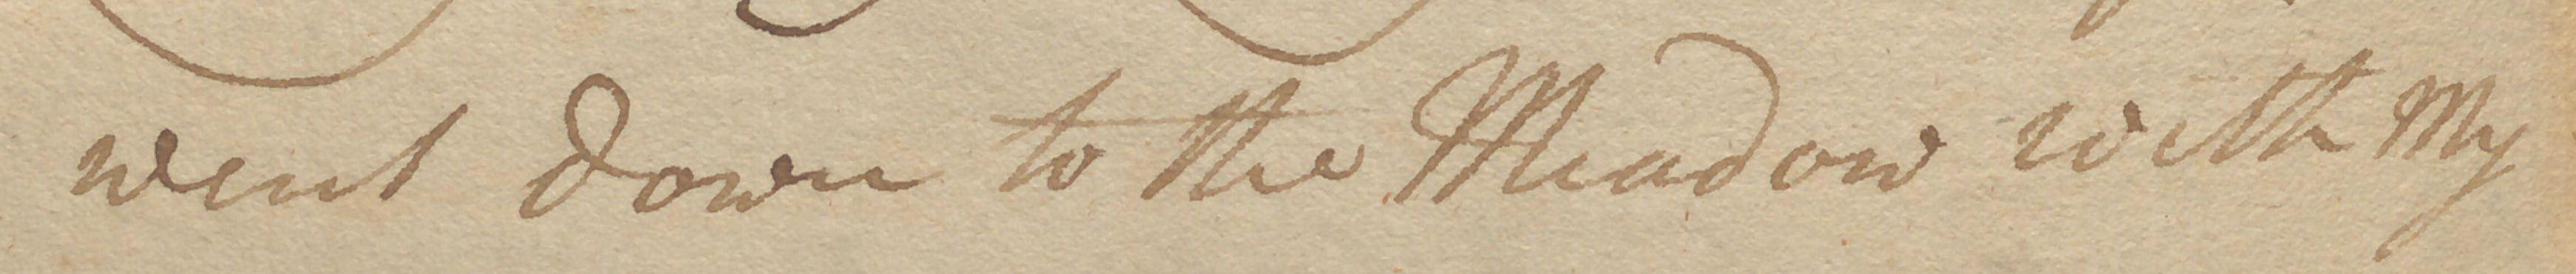went down to the Meadow with My
